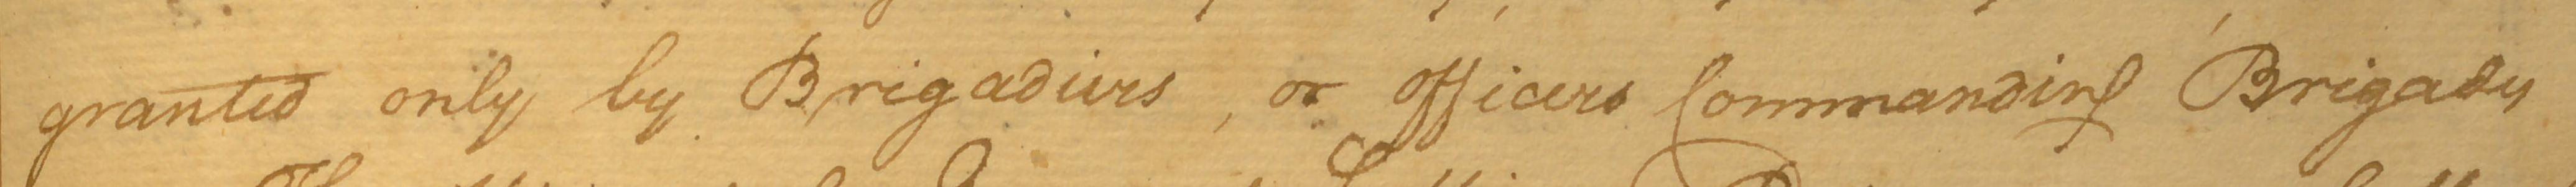granted only by Brigadiers or officers Commanding Brigades
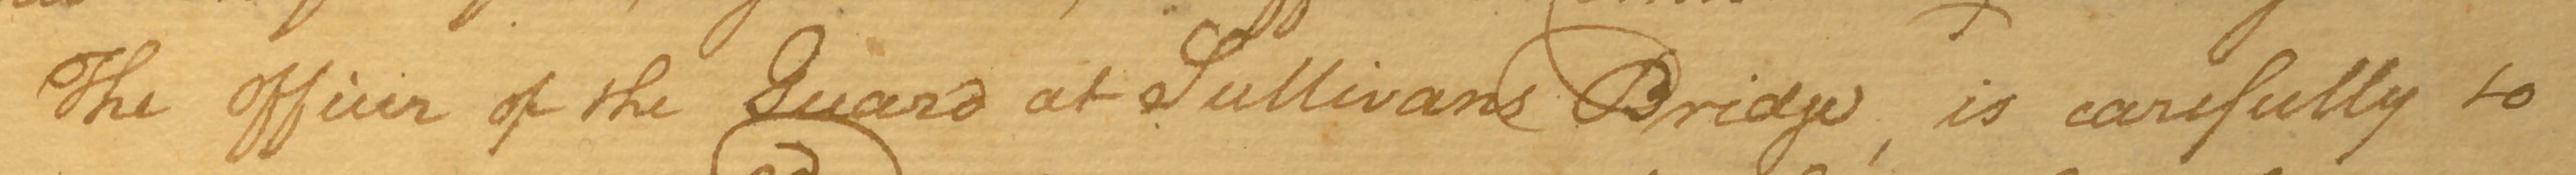The officer of the Guard at Sullivans Bridge, is carefully to
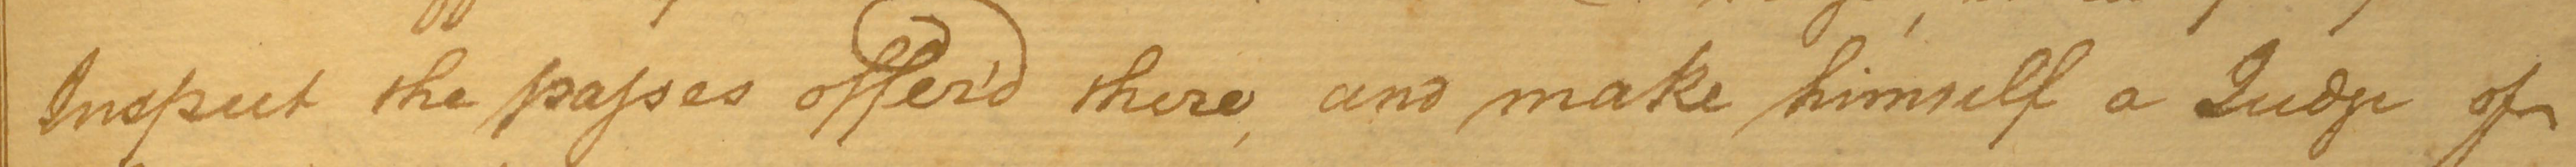Inspect the passes offer'd there and make himself a Judge of-
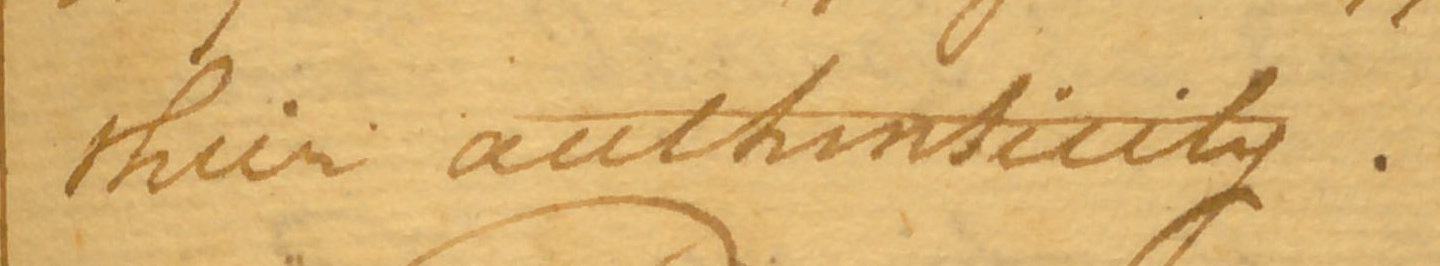their authenticity.
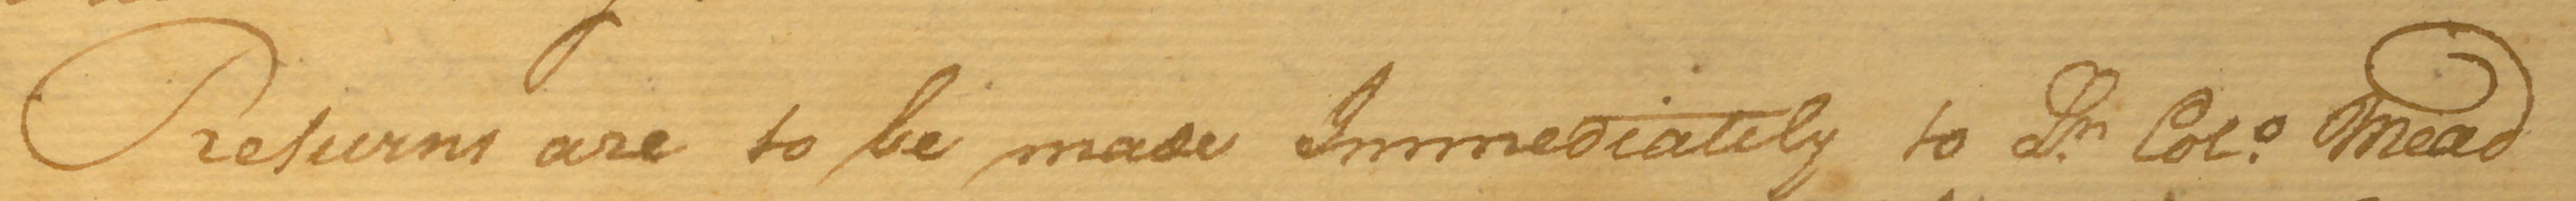Returns are to be made Immediately to L^t. Col^o. Mead
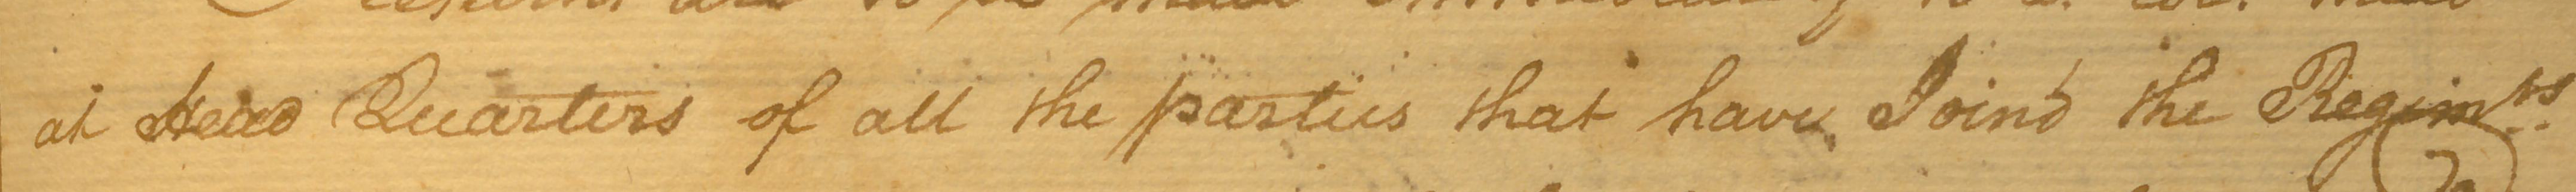at Head Quarters of all the parties that have Join'd the Regim^ts.
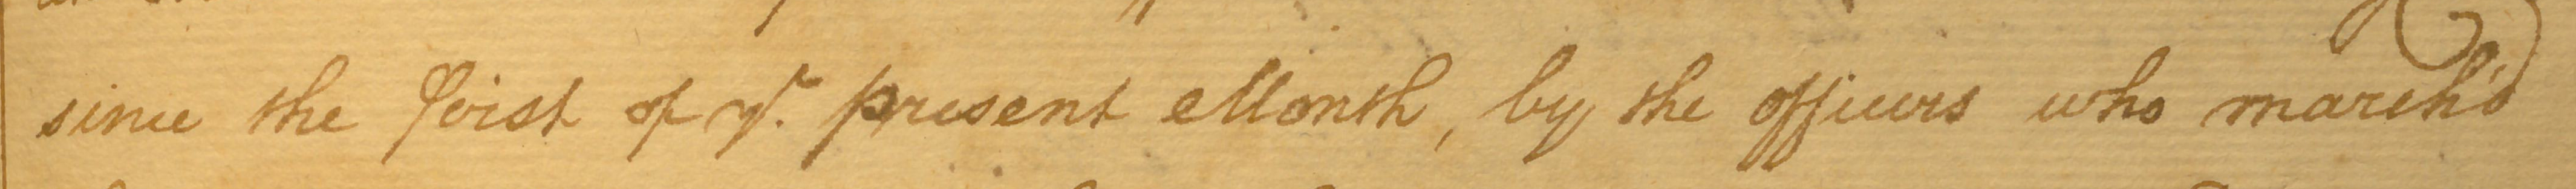since the first of y^e. present Month, by the officers who march'd
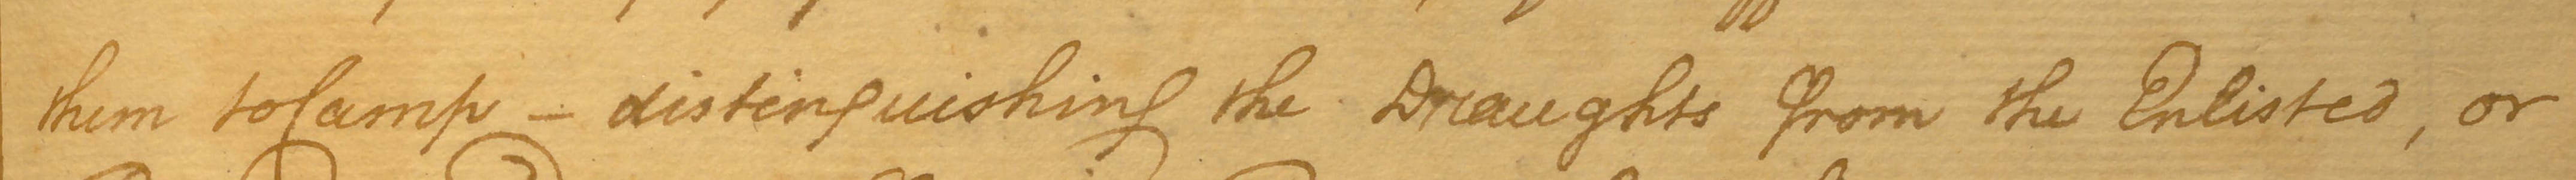them to Camp- distinguishing the Draughts from the Enlisted, or
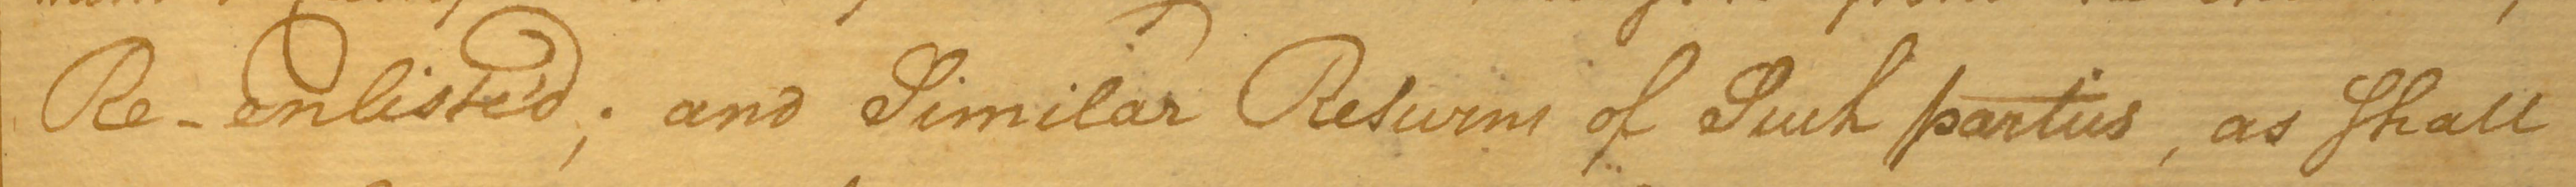Re-enlist'd; and similar Returns of such parties as shall
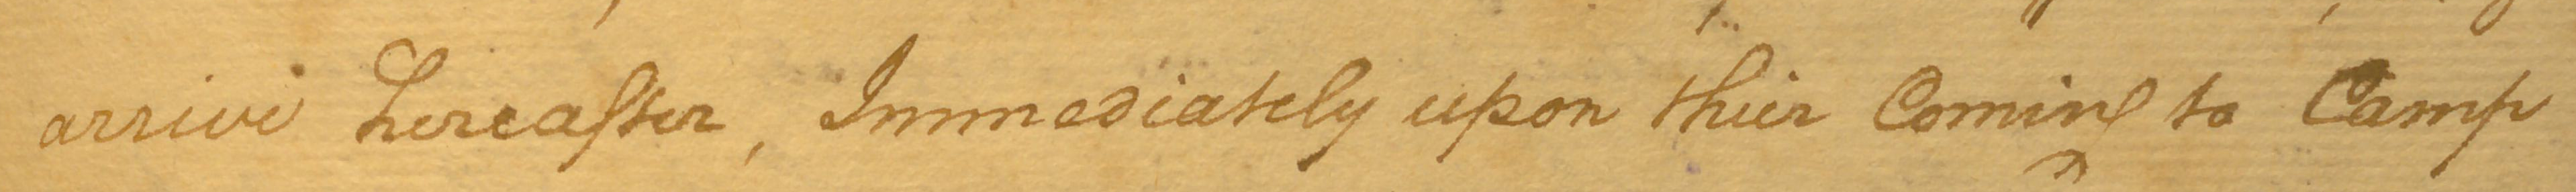arrive hereafter, Immediately upon their coming to camp
